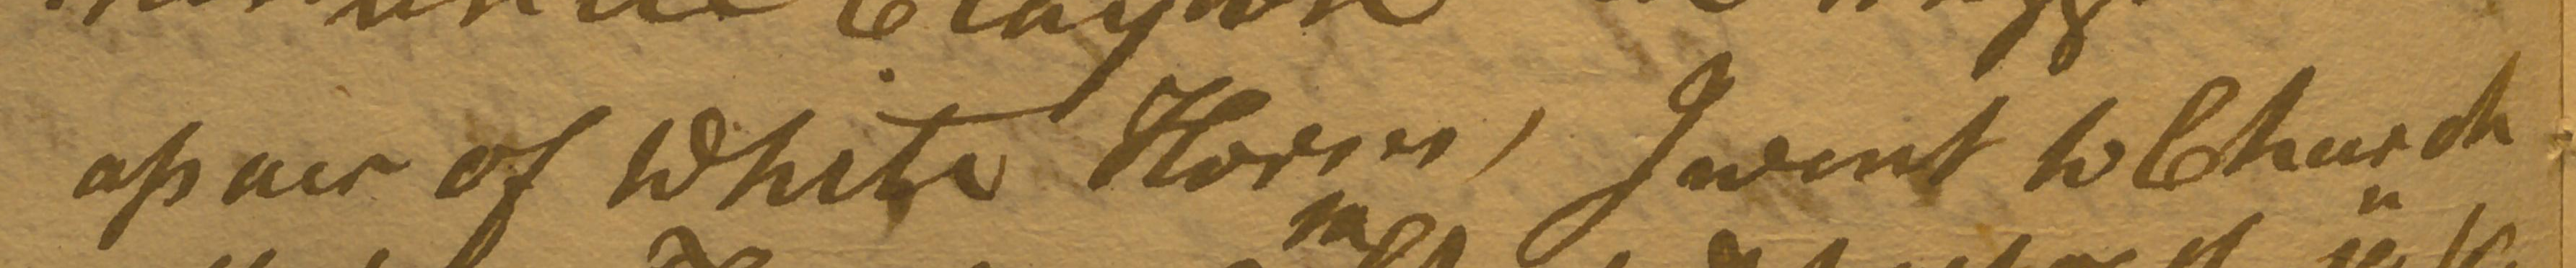a pair of White Horses, went to Church
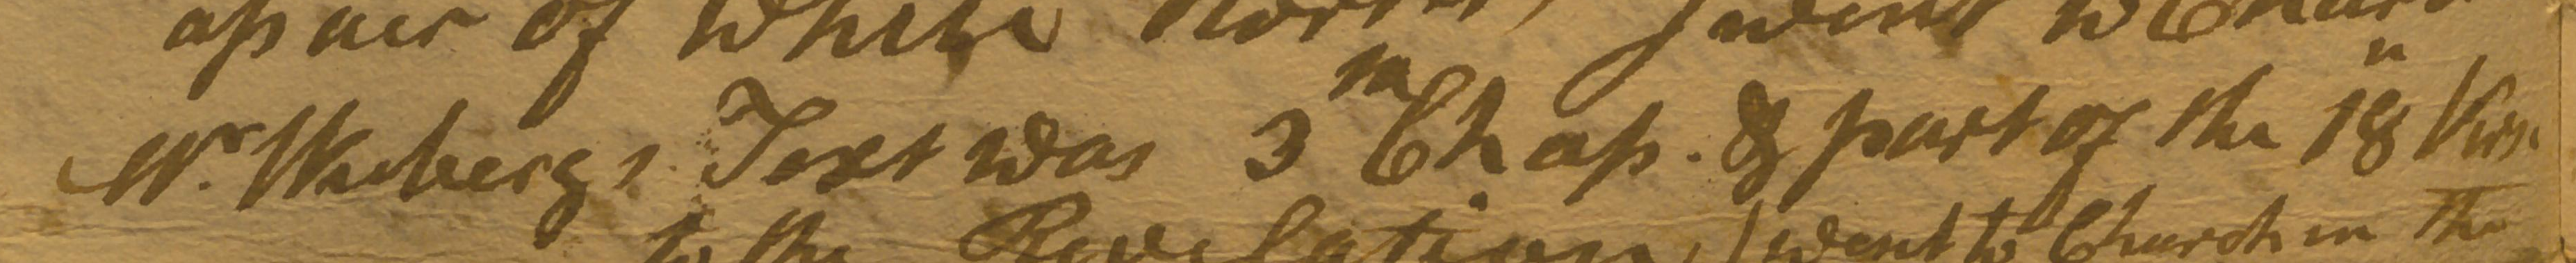M^r. Weibergs Text was 3^th Chap. & part of the 18^th Vers
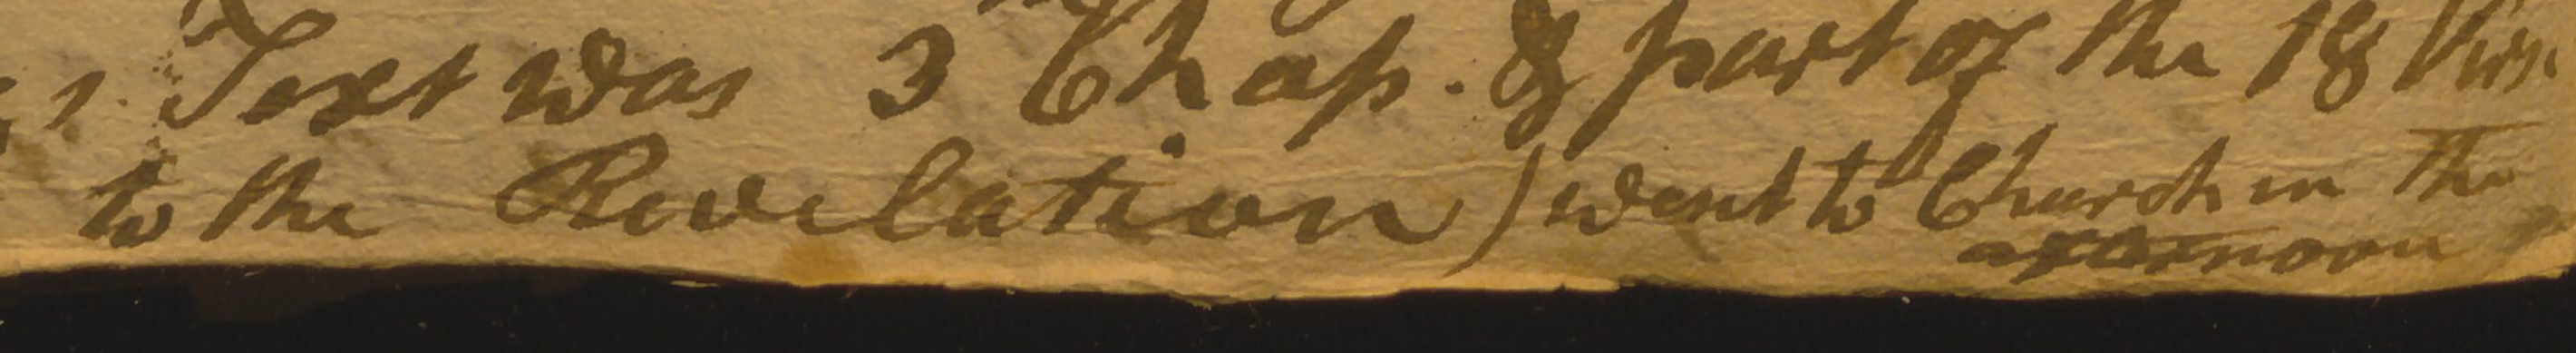to the Revelation / went to Church in the
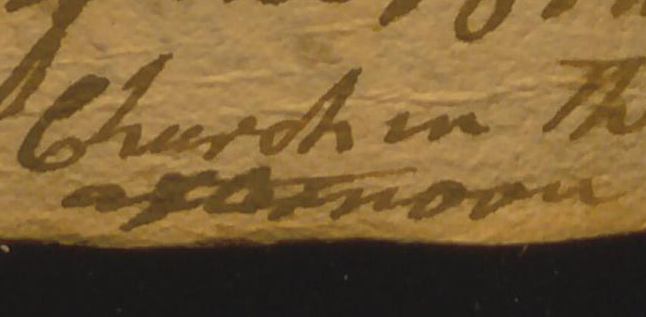afternoon
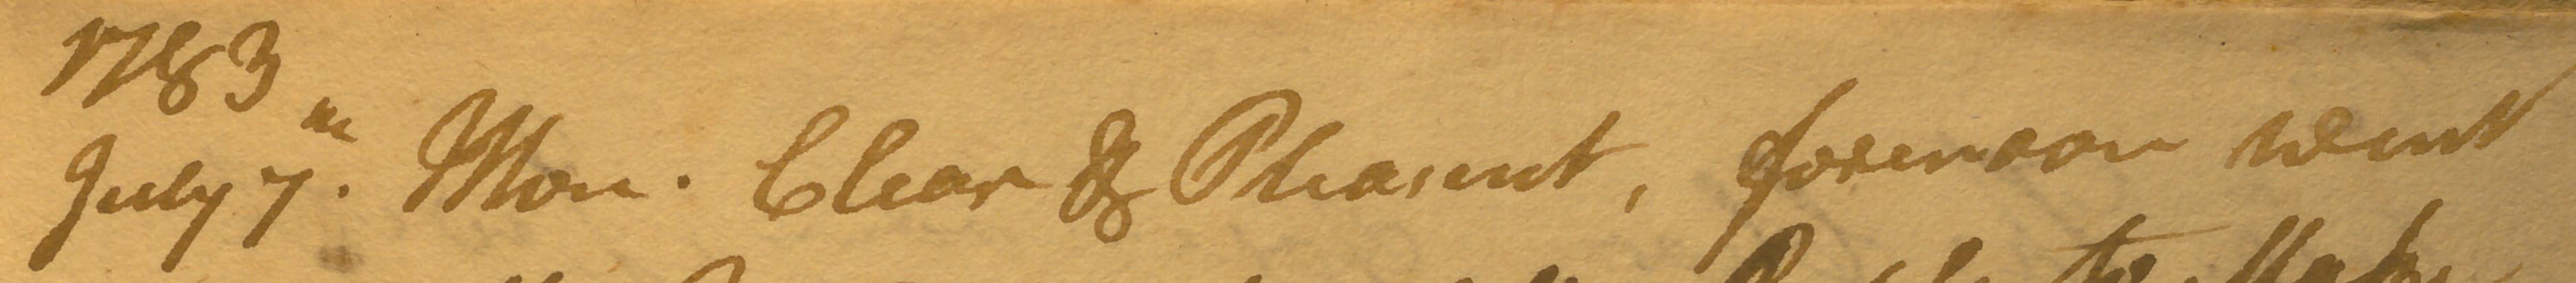July 7^th. Mon. Clear & Pleasent forenoon went
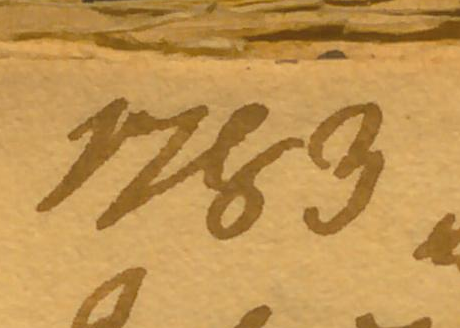1783
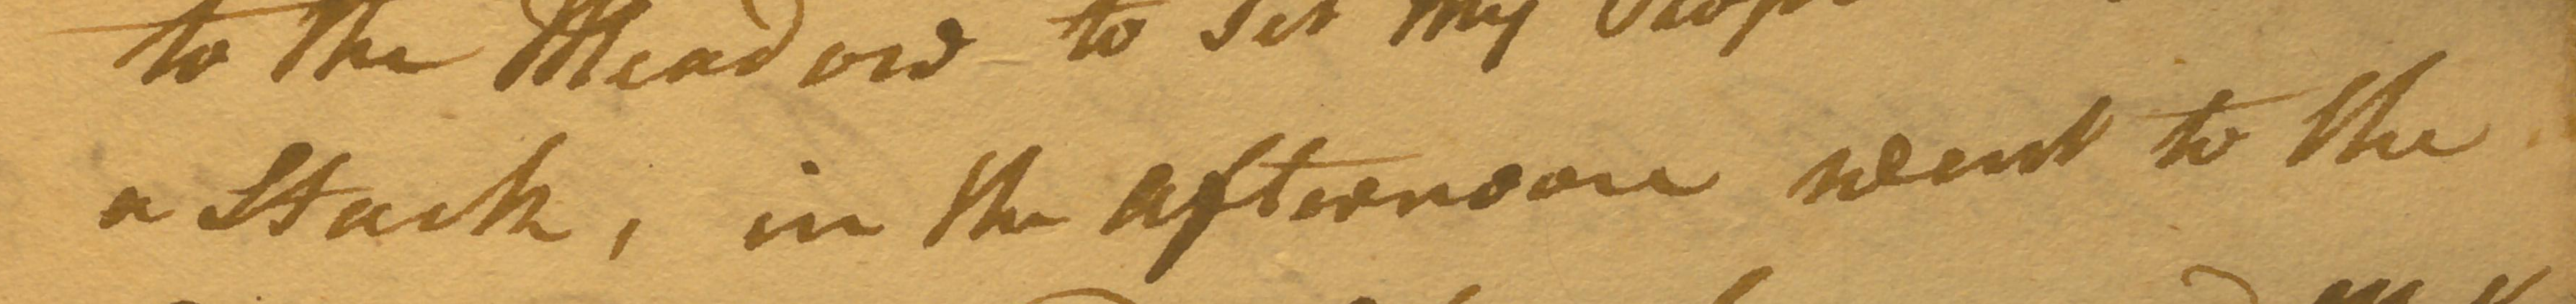a Stack, in the afternoon went to the
